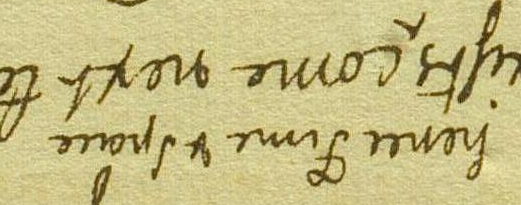hence Time & space
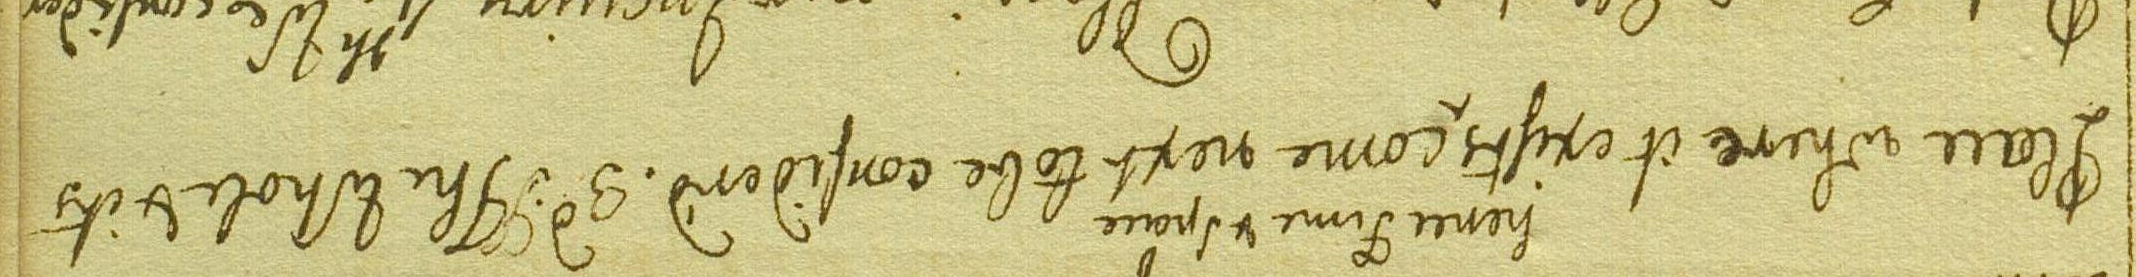Place where it exists ^ come next to be consider'd. 3^d The Whole & its
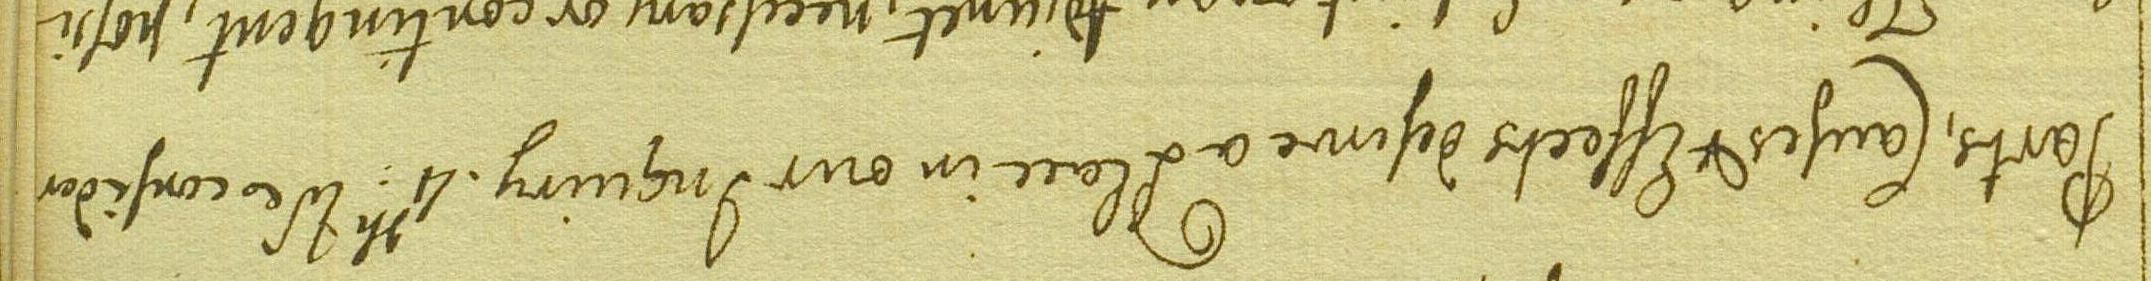Parts, Causes & Effects deserve a Place in our Inquiry. 4^th. We consider
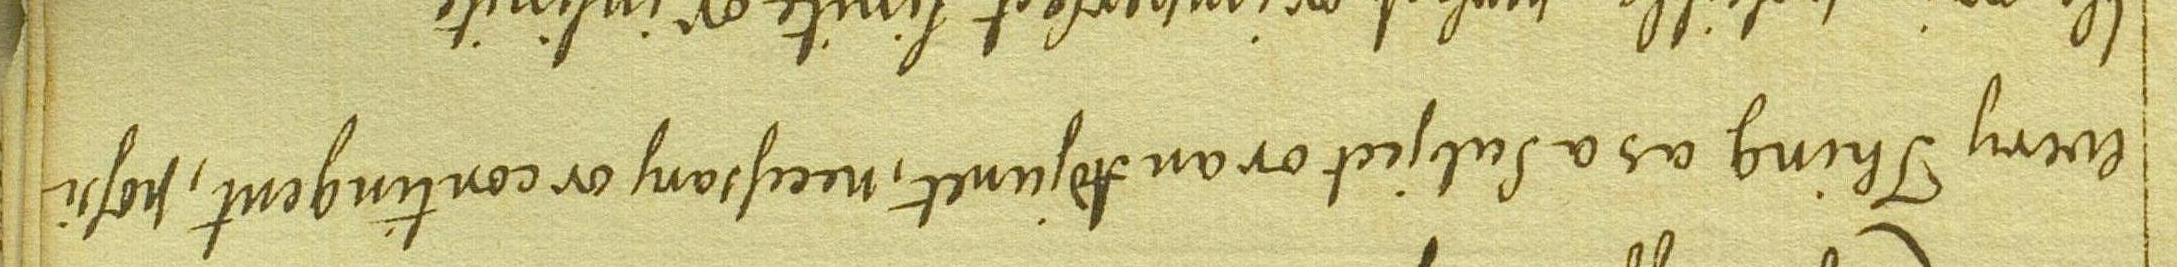every Thing as a Subject or an Adjunct, necessary or contingent, possi-
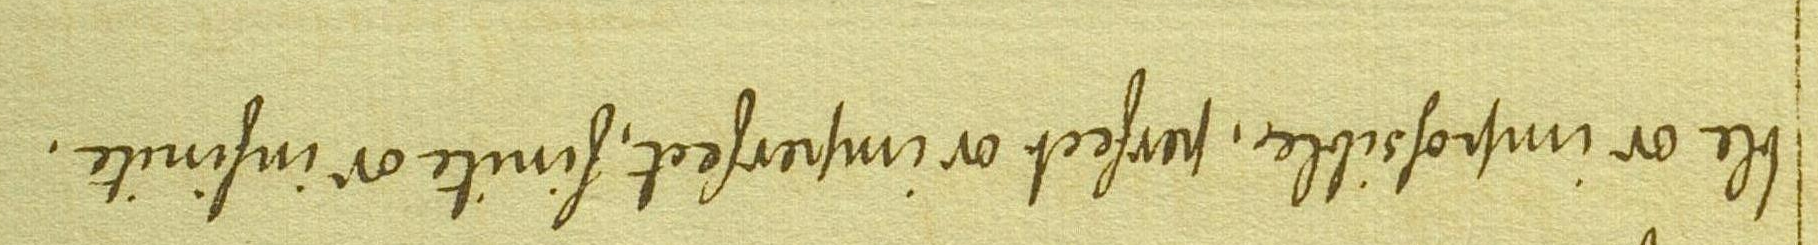ble or impossible, perfect or imperfect, finite or infinite.
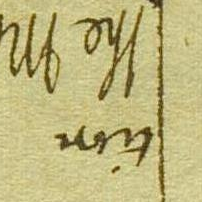tion
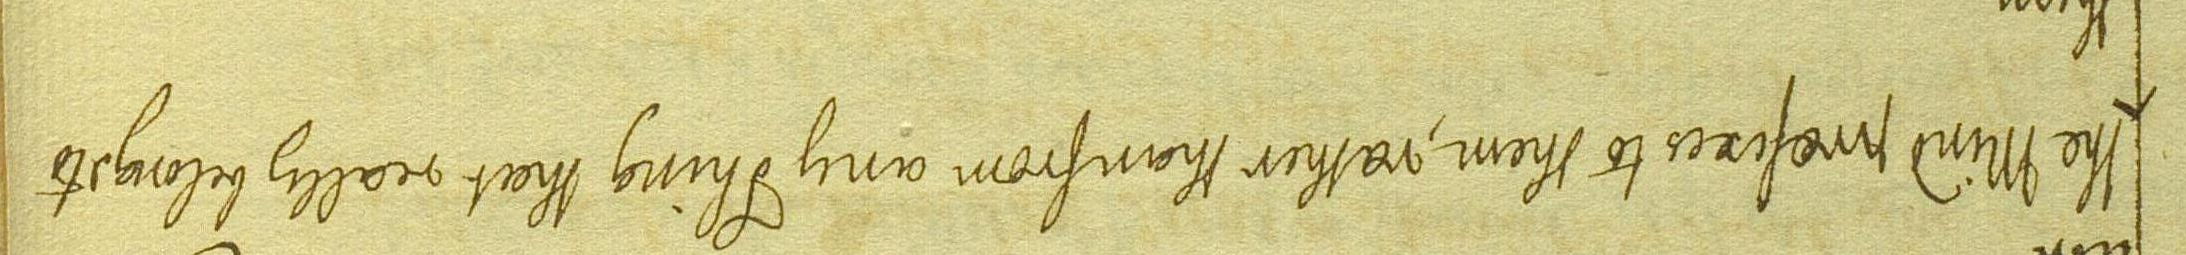^ the Mind prefixes to them, rather than from any Thing that really belongs to
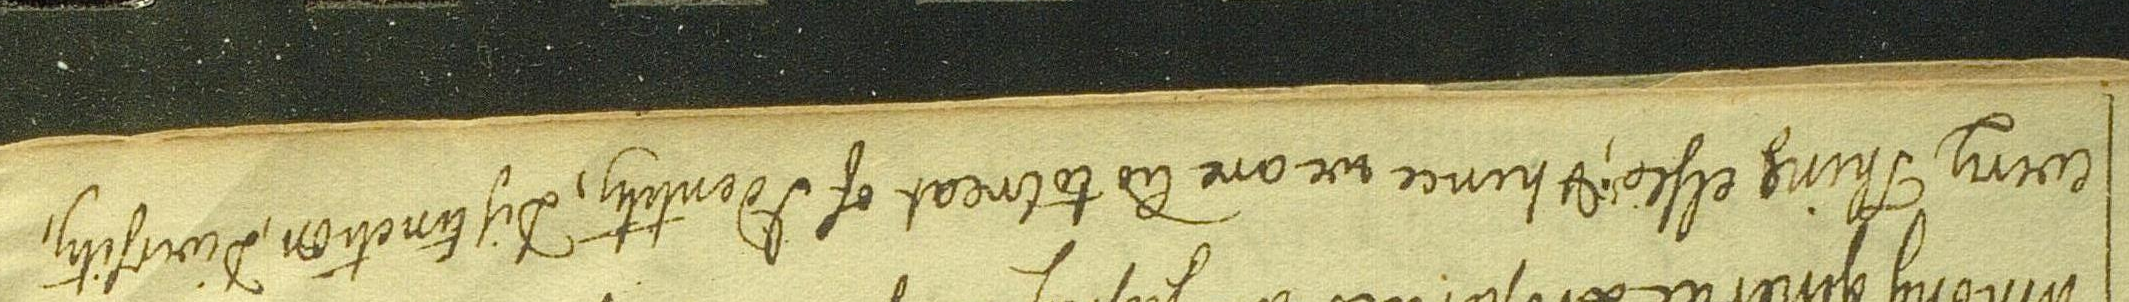every Thing else; & hence we are led to treat of Identity, Distinction, Diversity,
